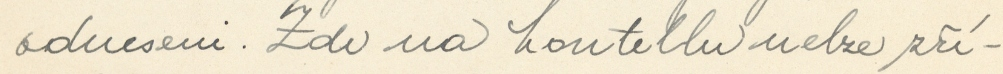odneseni. Zde na Montellu nelze zří-
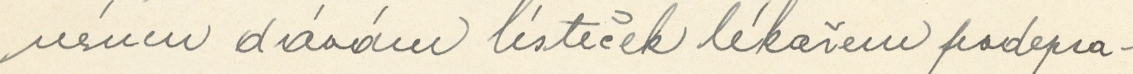nému dávám lísteček lékařem podepsa-
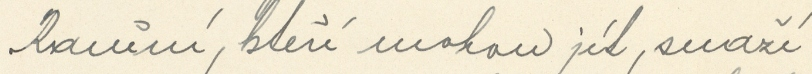Ranění, kteří mohou jít, snaží
